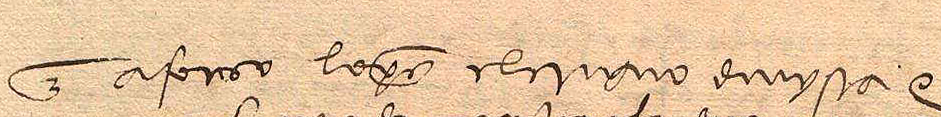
item afonso lopez cleriguo de myssa e
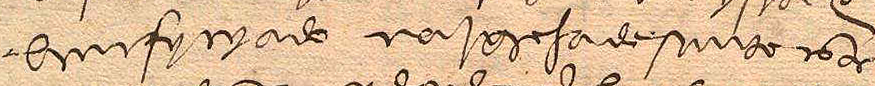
benefycyado na JgreJa de santo este
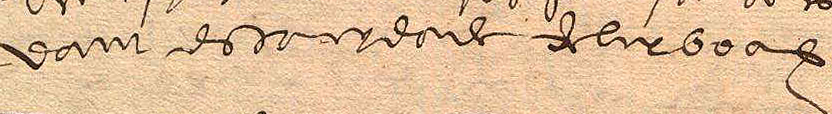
vam desta cydade de lixboa
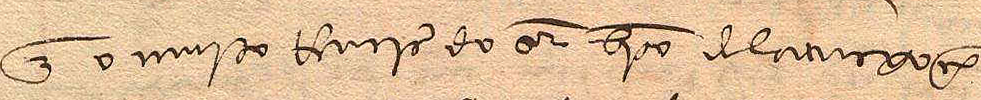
item o mujto Reuerēdo s̄or bpō de lamego c̄ꝭ
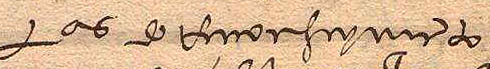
tas do Reconhecymēto
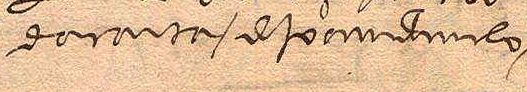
da carta / de Joam de melo
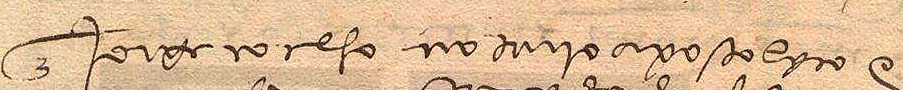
item Jorge coelho notairo apostolyco e
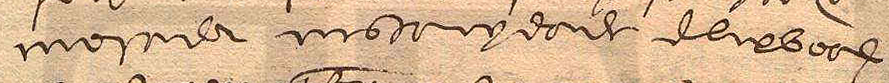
morador nesta cydade de lixboa
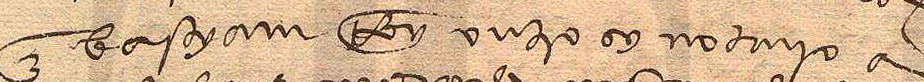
item bastyam Rōiz outrosy notairo a
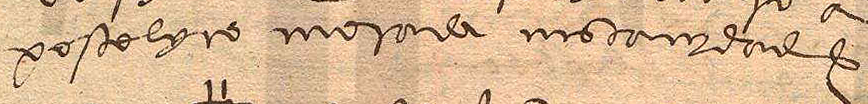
postolyco morador nesta cydade
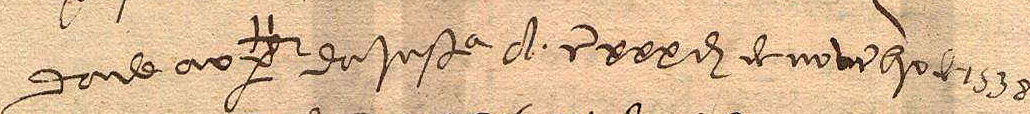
dado ao ꝓtor da Justa A. ē xxx dj de novēbro de 1538
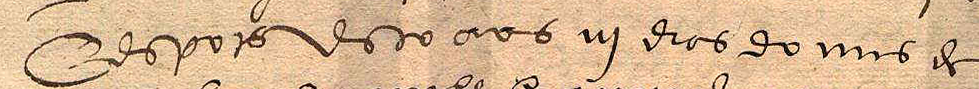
E despois desto aos iij dias do mes de
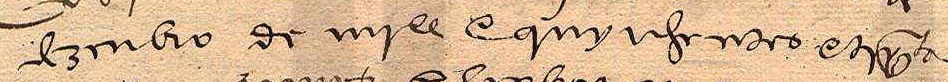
dezenbro de mjll e quynhentos e trȳta
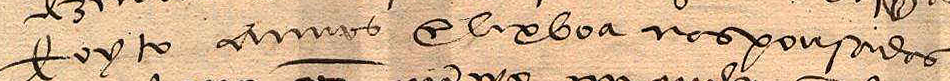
E oyto annos ē lixboa nas pousadas
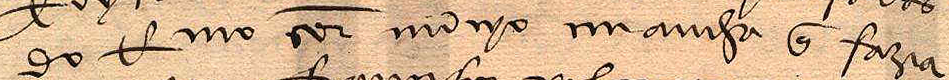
do Rmo s̄or nūcyo em audja q̄ fazia
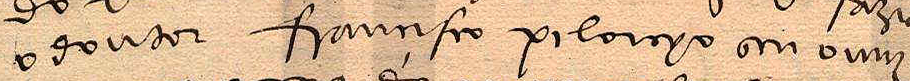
o doutor francisco pelorcyo seu ouuj
